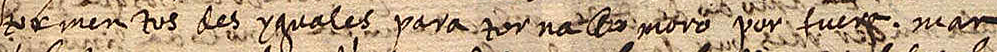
tormentos desyguales para tornallo moro por fuera. man
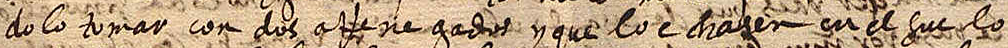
dolo tomar con dos aRenegados y que lo echasen en el suelo
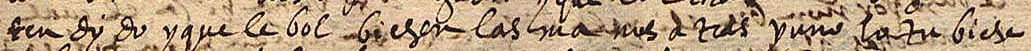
tendydo y que le volbiesen las manos atras y uno lo tuviese
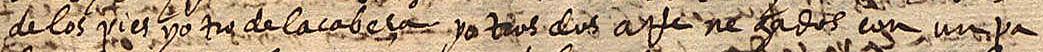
de los pies y otro de la cabeça y otros dos aRenegados con un pa
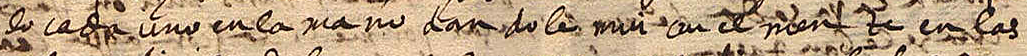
lo cada uno en la mano dandole mui cruelmente en las
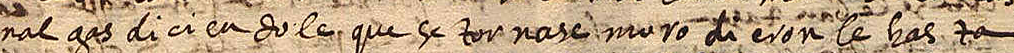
nalgas diciendole que se tornase moro dieron le hasta
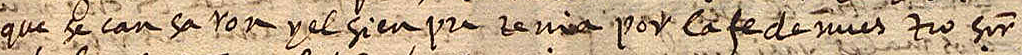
que se cansaron y el sienpre tenia por la fe de nuestro sor̄
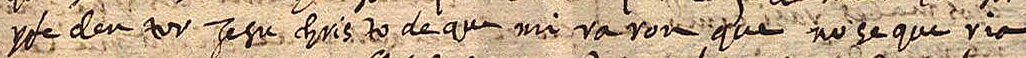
y Redentor Jesu christo de que miraron que no se queria
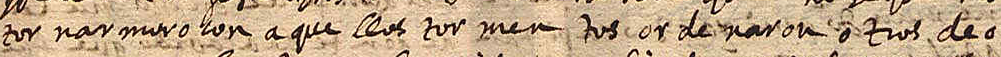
tornar moro con aquellos tormentos ordenaron otros de o
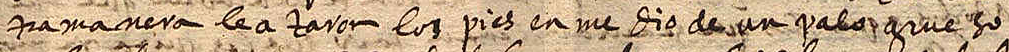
tra manera le ataron los pies en medio de un palo grueso
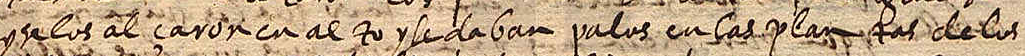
y se los alçaron en alto y le daban palos en las plantas de los
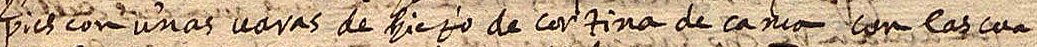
pies con unas uaras de hieRo de cortina de cama con las cua
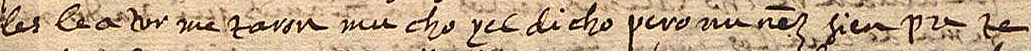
les le atormentaron mucho y el dicho pero nun̄ez sienpre te
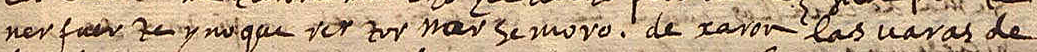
ner fuerte y no querer tornar se moro dexaron las uaras de
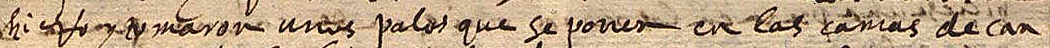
hieRo y tomaron unos palos que se ponen en las camas de can
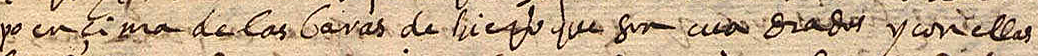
po en cima de las varas de hieRo que son cuadrados y con ellas
